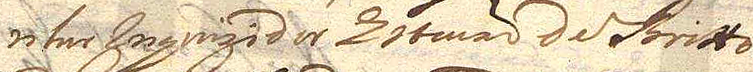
nhor Jnquizidor Esteuaõ de Britto
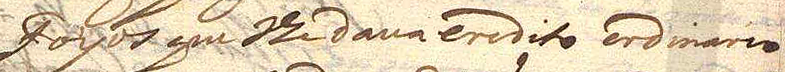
Foyos que lhe daua credito ordinario
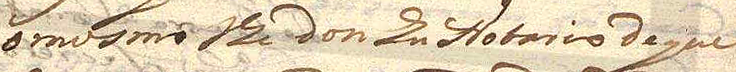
o mesmo lhe dou Eu Notario de que
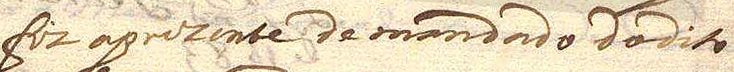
fiz a prezente de mandado do dito
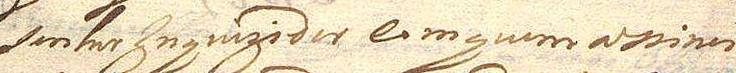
senhor Jnquizidor com quem assinei
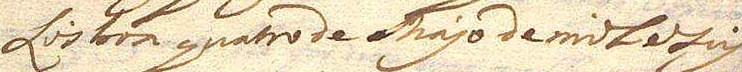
Lisboa quatro de Majo de miL e seis
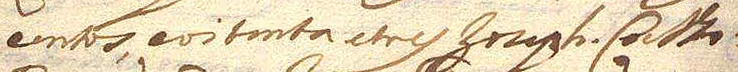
centos, e oitenta e tres Jozeph. Coelho
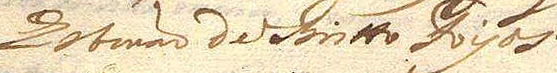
Esteuaõ de Britto Foyos.
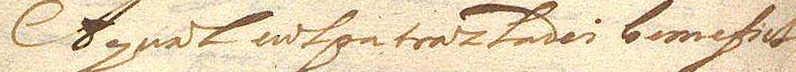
A quaL culpa trazLadei bem e fiel
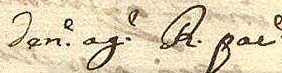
den.e ag.e R. pace.
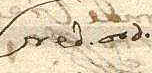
Cred. ord.
